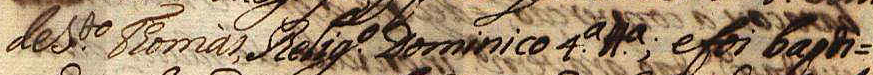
de s.to Thomas, Relig.o Dominico 4.a tt.a; e foi bapti
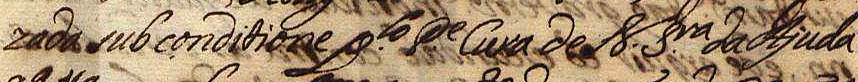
zada sub conditione p.lo P.e Cura de N. S.ra da Ajuda
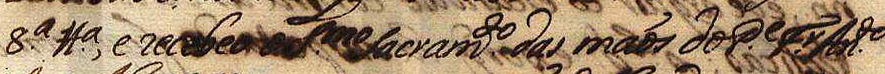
8.a tt.a, e recebeo o S.m sacramto. das maõs do P.e Fr. An.to
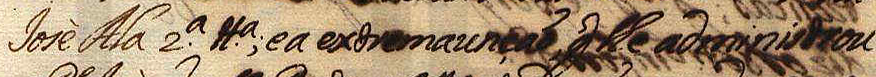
Iosè Ala 2.a tt.a; e a extrema unçaõ, q̄ lhe administrou
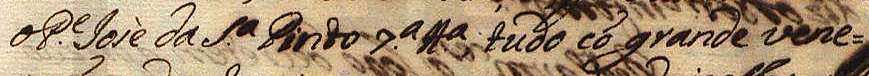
o P.e Iosè da S.a Pinto 7.a tt.a, tudo cō grande vene
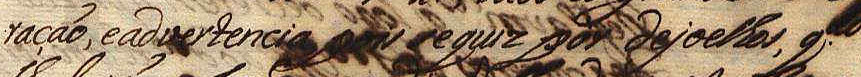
raçaõ, e advertencia pois se quiz por de joelhos q.do
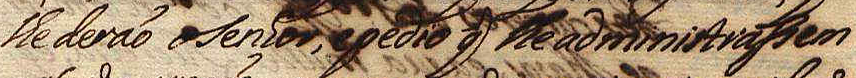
lhe deraõ o senhor, e pedio q̄ lhe administrassem
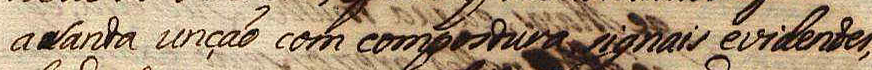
a santa unçaõ com compostura signais evidentes,
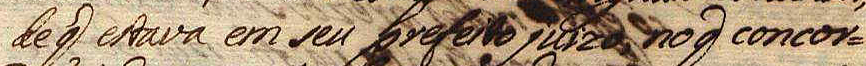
de q̄ estava em seu prefeito juizo no q̄ concor
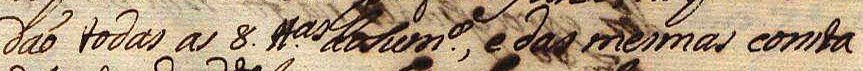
daõ todas as 8. tt.as do Sumo, e das mesmas consta
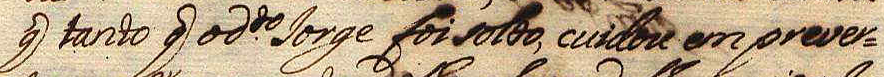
q̄ tanto q̄ o d.to Iorge foi solto, cuidou em prever
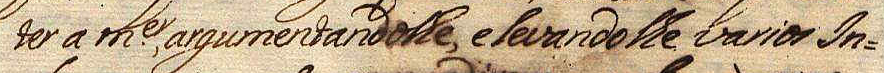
ter a m.er, argumentandolhe, e levandolhe varios In
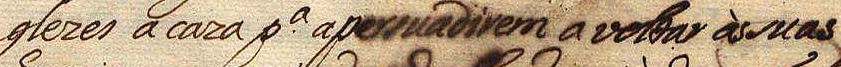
glezes a caza p.a a persuadirem a voltar às suas
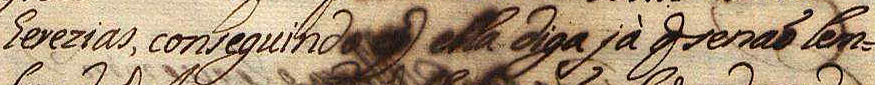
herezias, conseguindo q̄ ella diga jà q̄ se naõ lem
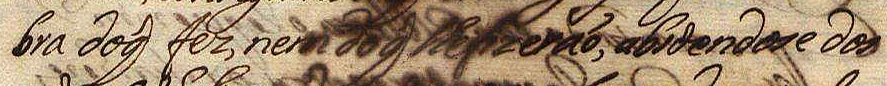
bra do q̄ fez, nem do q̄ lhe fizeraõ, abstendose dos
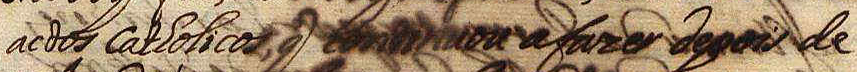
actos catholicos, q̄ continuou a fazer depois de
